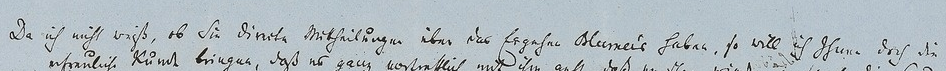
Da ich nicht weiß, ob Sie directe Mittheilungen über das Ergehen Blumer`s haben, so will ich Ihnen doch die
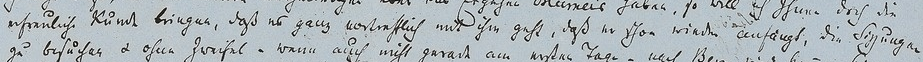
erfreuliche Kunde bringen, daß es ganz vortrefflich mit ihm geht, daß er schon wieder anfängt, die Sitzungen
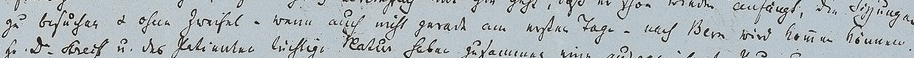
zu besuchen & ohne Zweifel ­ wenn auch nicht gerade am ersten Tage – nach Bern wird kommen können.
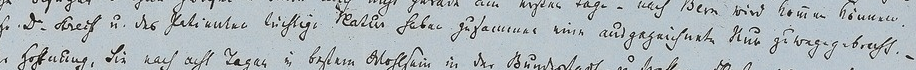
Hr. D. Streiff u. des Patienten tüchtige Natur haben zusammen eine ausgezeichnete Kur zuwegegebracht. –
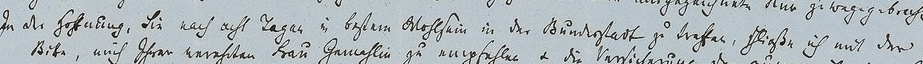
In der Hoffnung, Sie nach achten Tagen in bestem Wohlsein in der Bundesstadt zu treffen, schließe ich mit der
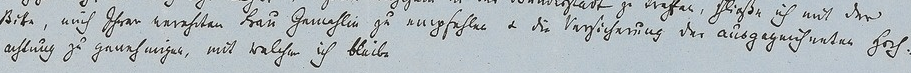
Bitte, mich Ihrer verehrten Frau Gemahlin zu empfehlen & die Versicherung der ausgezeichnten Hoch-
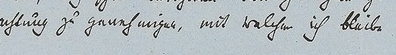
achtung zu genehmigen, mit welcher ich bleibe
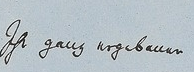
Ihr ganz ergebener
